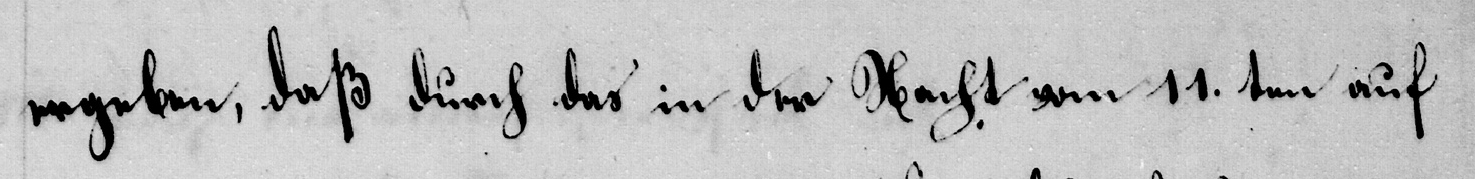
ergeben, daß durch das in der Nacht vom 11.ten auf
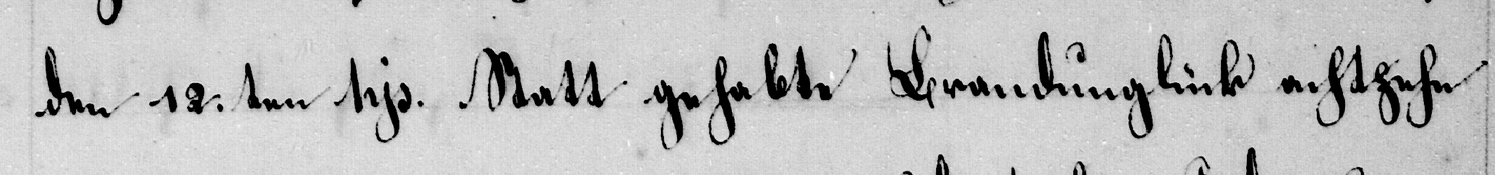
den 12.ten hjs. Statt gehabte Brandunglück achtzehn
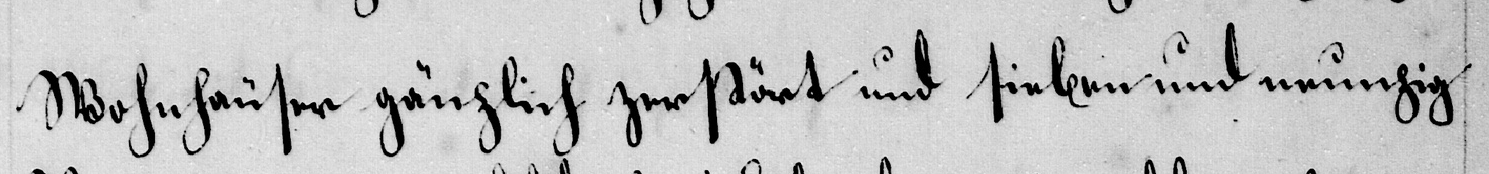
Wohnhäuser gänzlich zerstört und sieben und neunzig
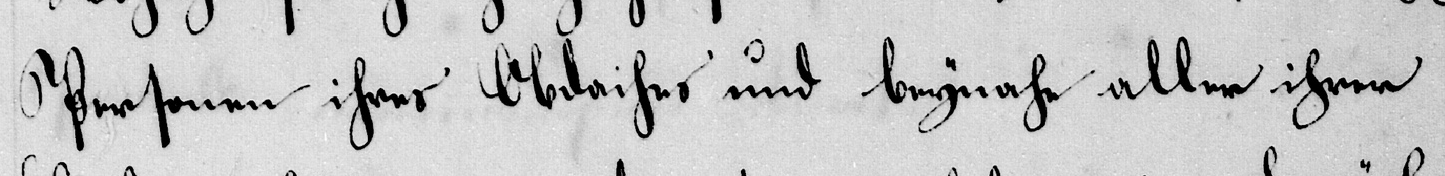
Personen ihres Obdaches und beynahe aller ihrer
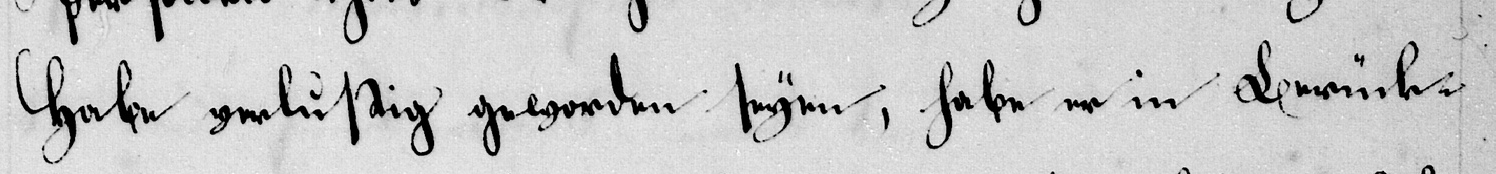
Habe verlustig geworden seyen, habe er in Berück¬
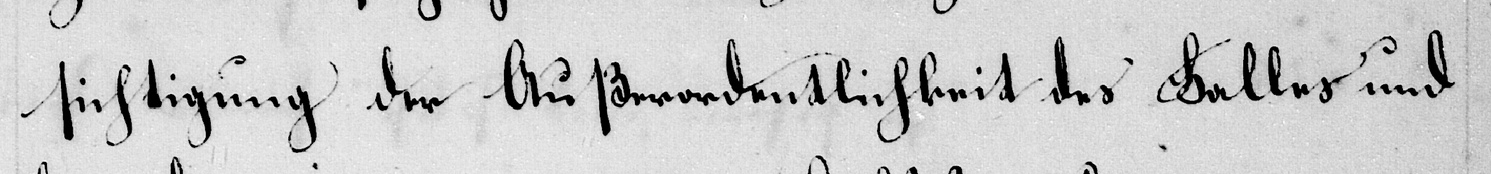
sichtigung der Außerordentlichkeit des Falles und
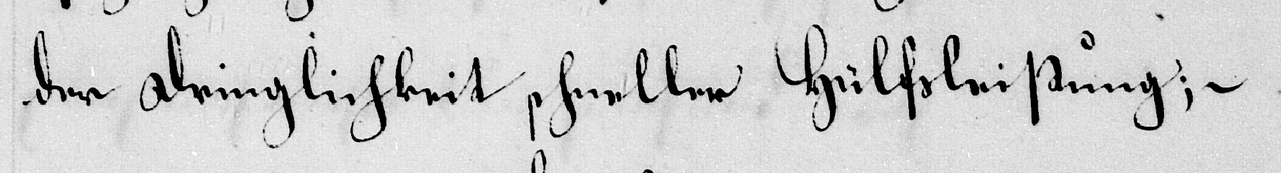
der Dringlichkeit schneller Hülfsleistung; –
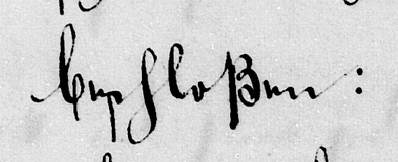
beschloßen:
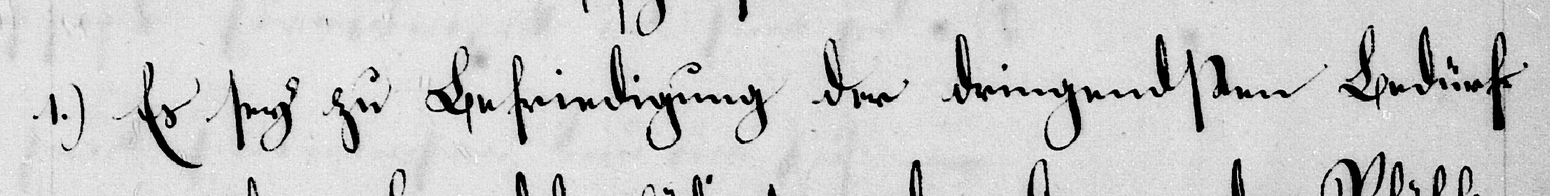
1.) Es sey zu Befriedigung der dringendsten Bedürf¬
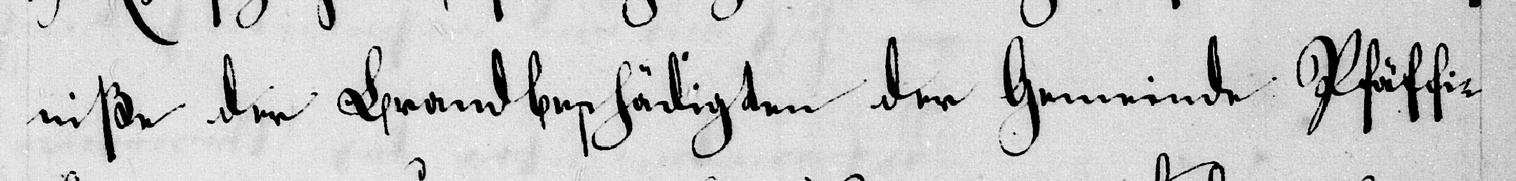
niße der Brandbeschädigten der Gemeinde Pfäffi¬
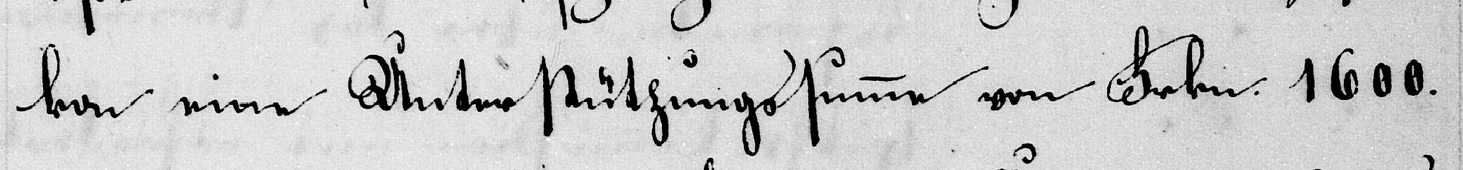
kon eine Unterstützungssumme von Frkn. 1600.
